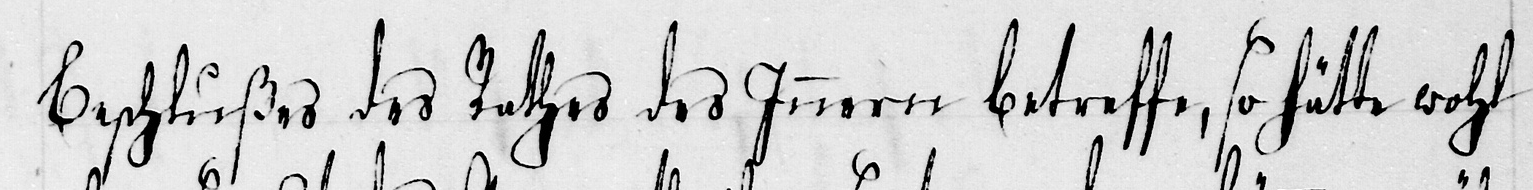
Beschlußes des Rathes des Innern betreffe, so hätte wohl
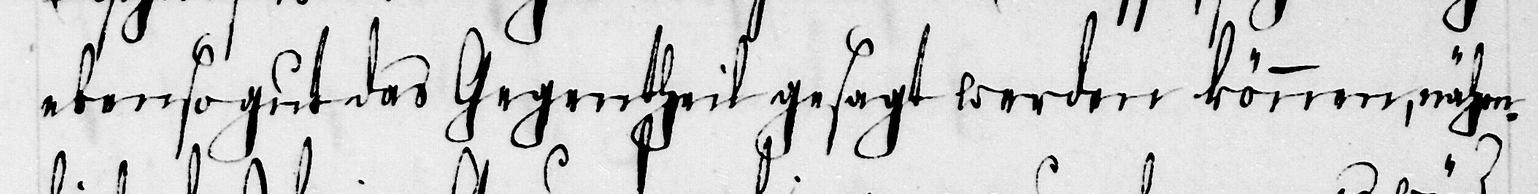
ebensogut das Gegentheil gesagt werden können, nähm¬
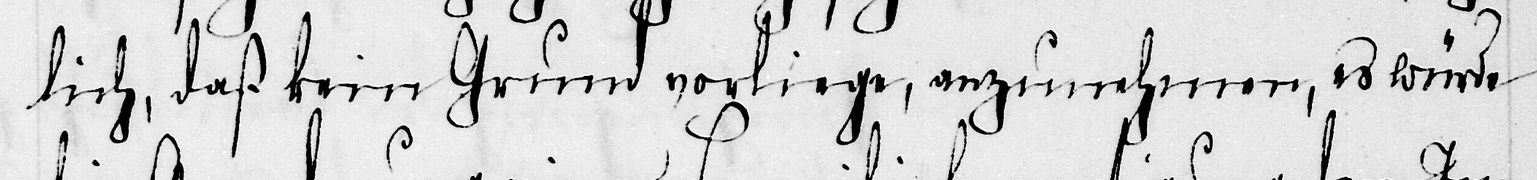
lich, daß kein Grund vorliege, anzunehmen, es würde
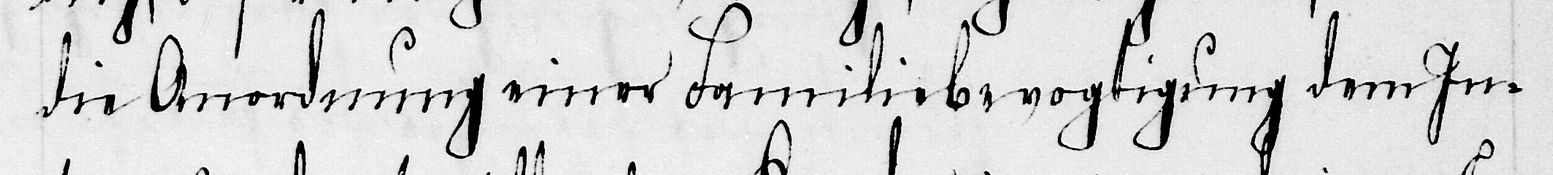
die Anordnung einer Familienbevogtigung dem In¬
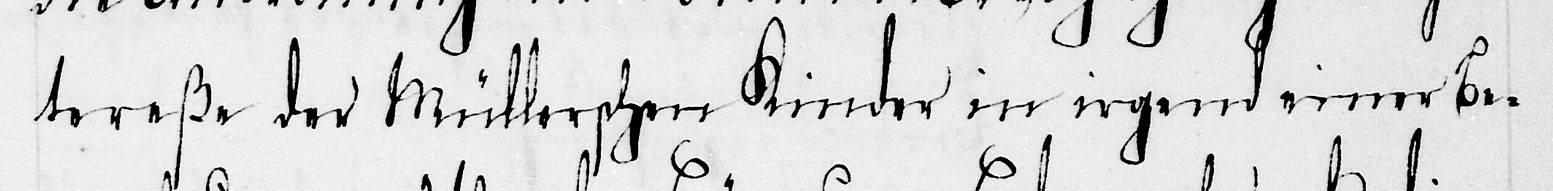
tereße der Müllerschen Kinder in irgend einer Be¬
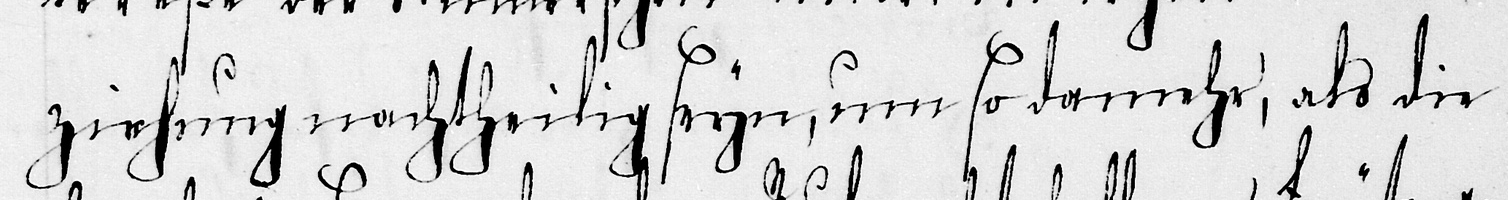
ziehung nachtheilig seyn, um so damehr, als die
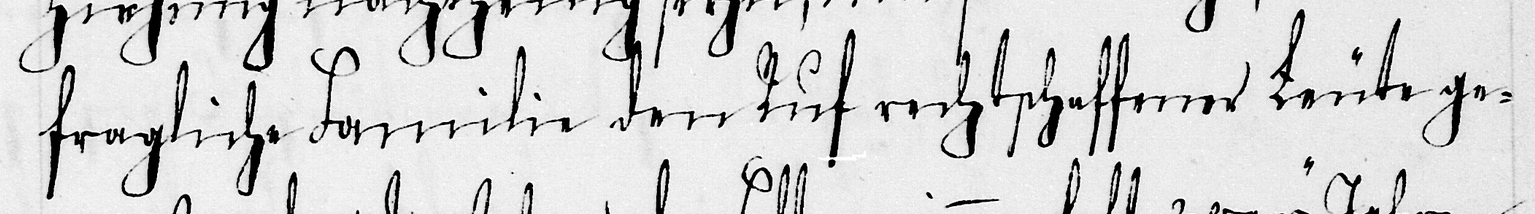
fragliche Familie den Ruf rechtschaffener Leute ge¬
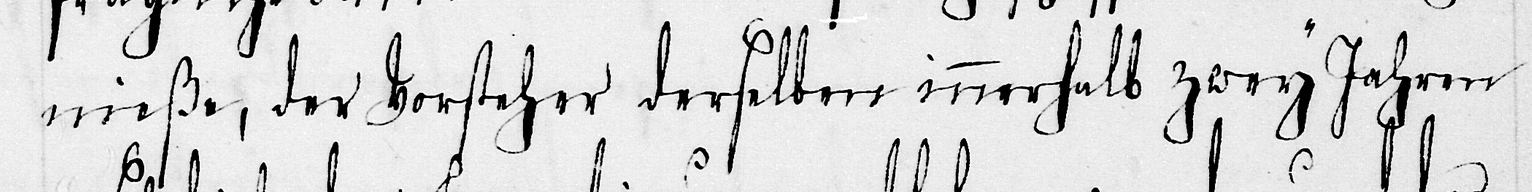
nieße, der Vorsteher derselben innerhalb zwey Jahren
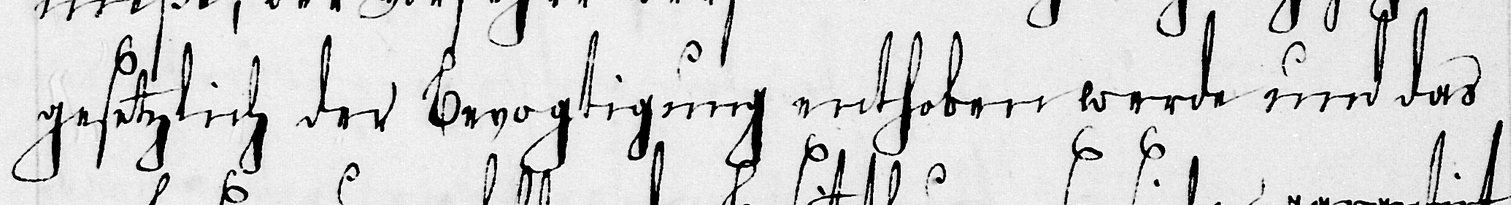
gesetzlich der Bevogtigung enthoben werde und das
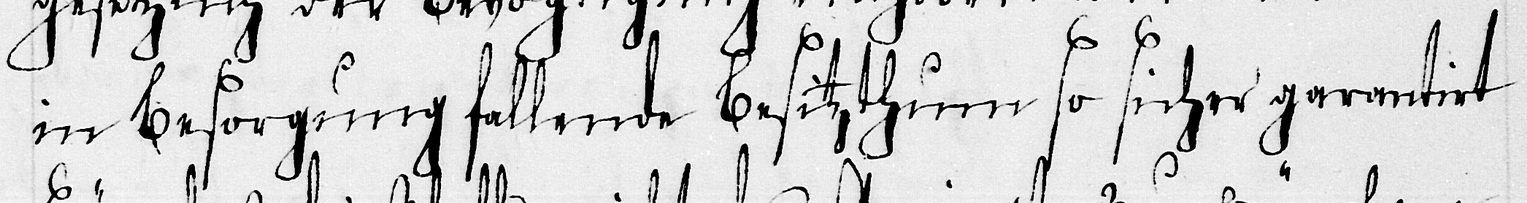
in Besorgung fallende Besitzthum so sicher garantirt
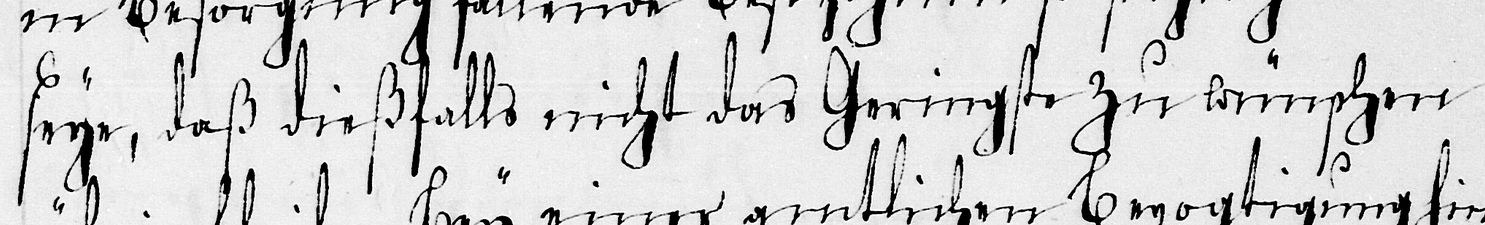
seye, daß dießfalls nicht das Geringste zu wünschen
